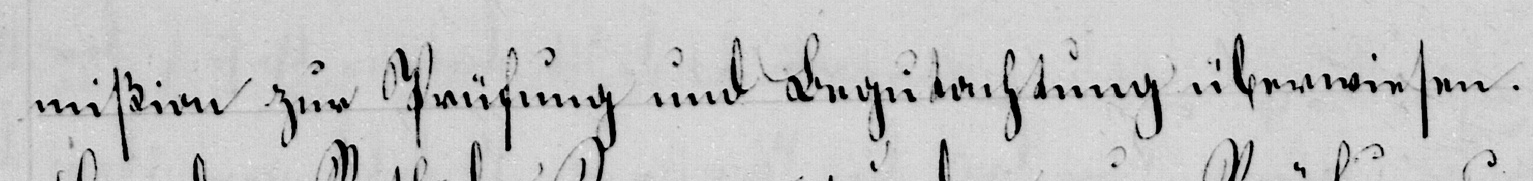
mißion zur Prüfung und Begutachtung überwiesen.
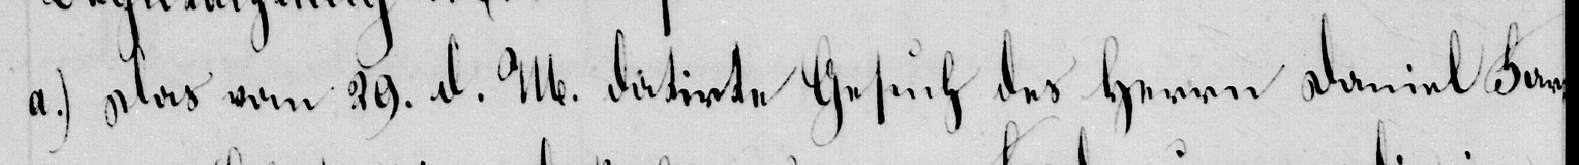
a.) Das vom 29. d. M. datirte Gesuch des Herrn Daniel Far¬
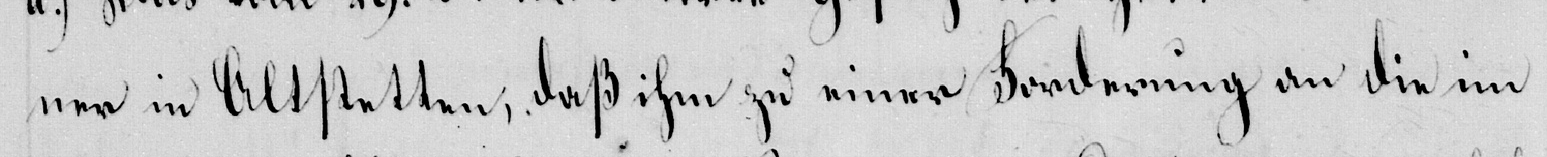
ner in Altstetten, daß ihm zu einer Forderung an die im
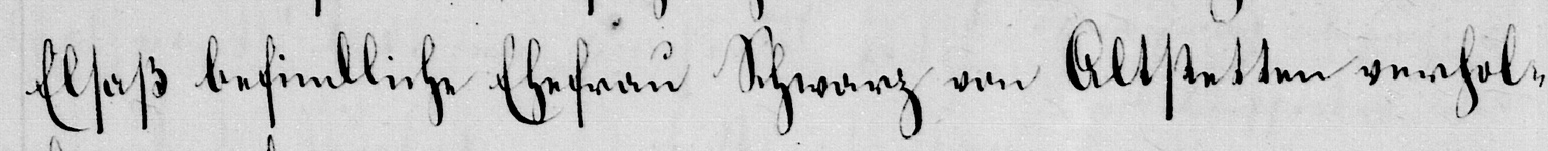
Elsaß befindliche Ehefrau Schwarz von Altstetten verhol¬
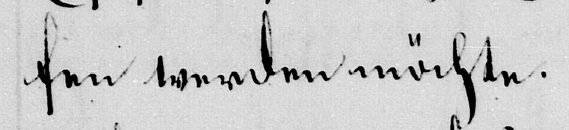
fen werden möchte.
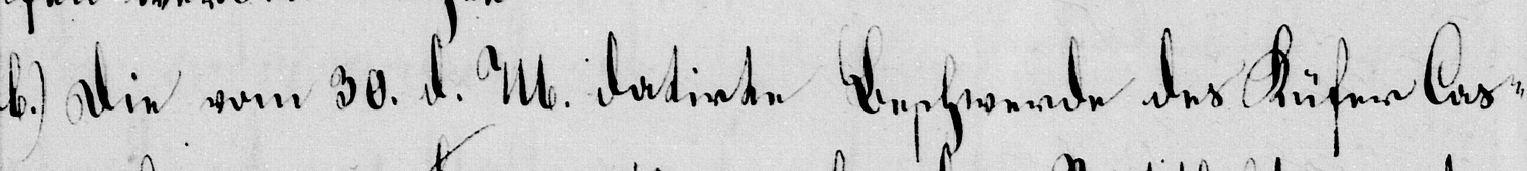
b.) Die vom 30. d. M. datirte Beschwerde des Küfer Cas¬
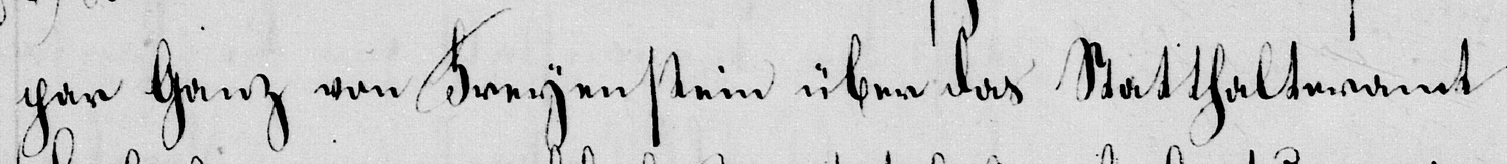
par Ganz von Freyenstein über das Statthalteramt
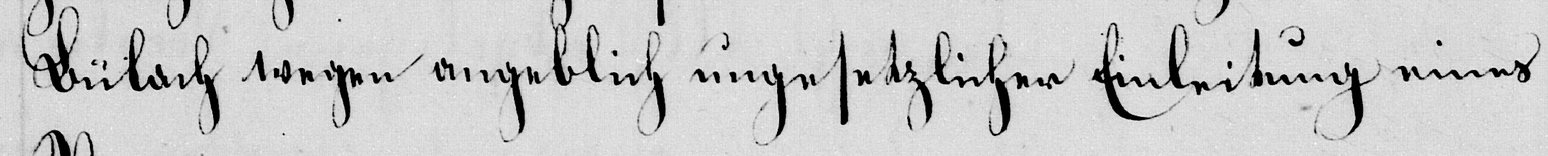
Bülach wegen angeblich ungesetzlicher Einleitung eines
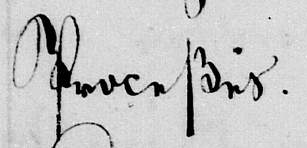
Proceßes.
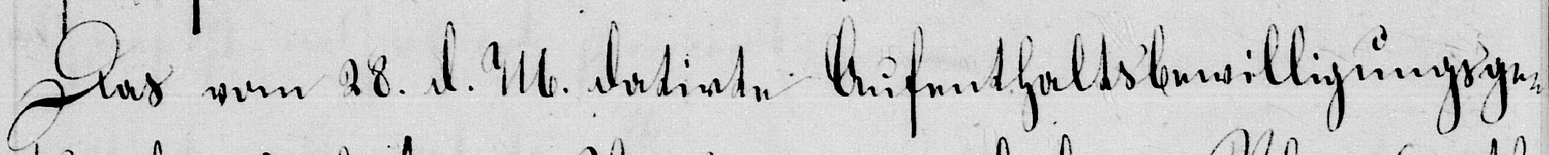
Das vom 28. d. M. datirte Aufenthaltsbewilligungsge¬
